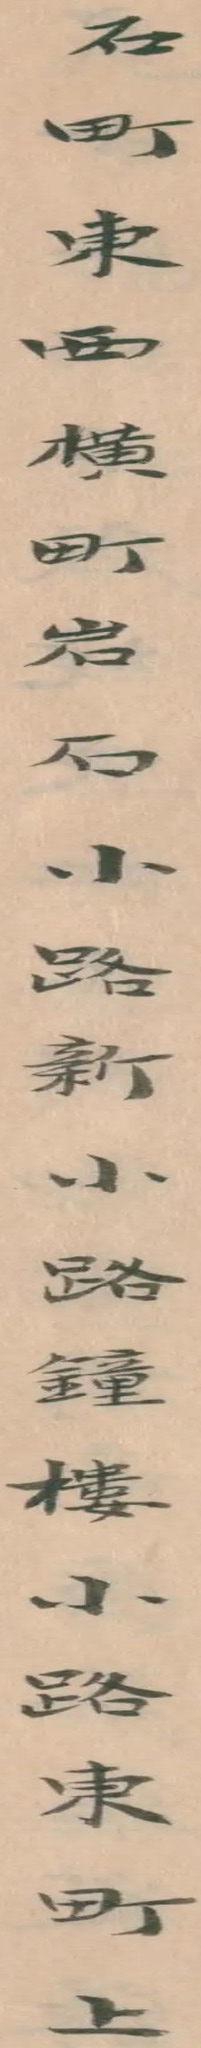石町東西横町岩石小路新小路鐘楼小路東町上
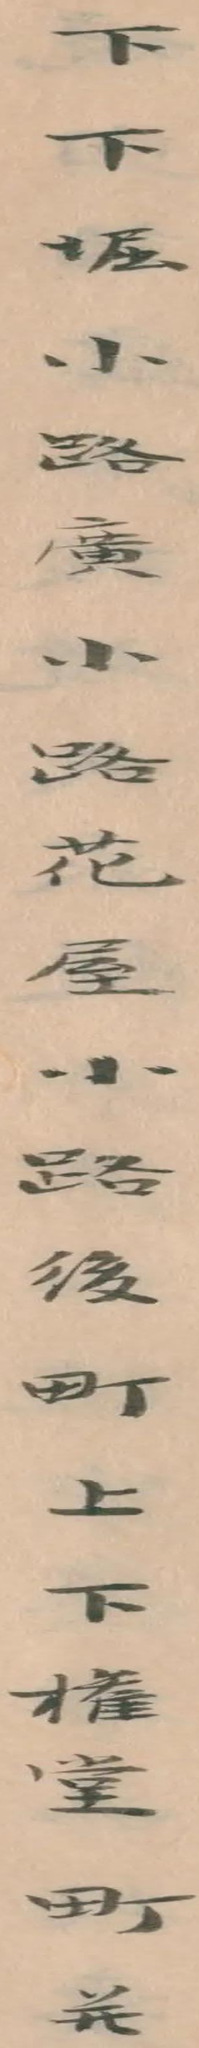下下堀小路広小路花屋小路後町上下権堂町并
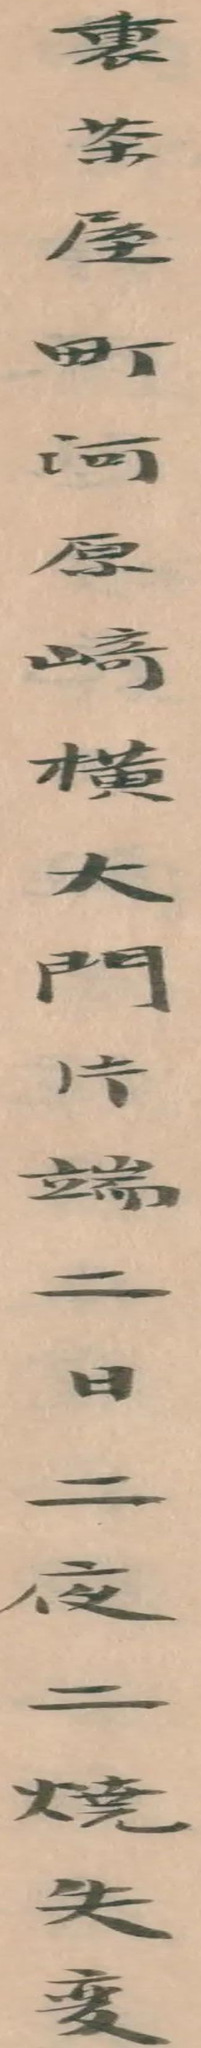裏茶屋町河原崎横大門片端二日二夜二焼失変
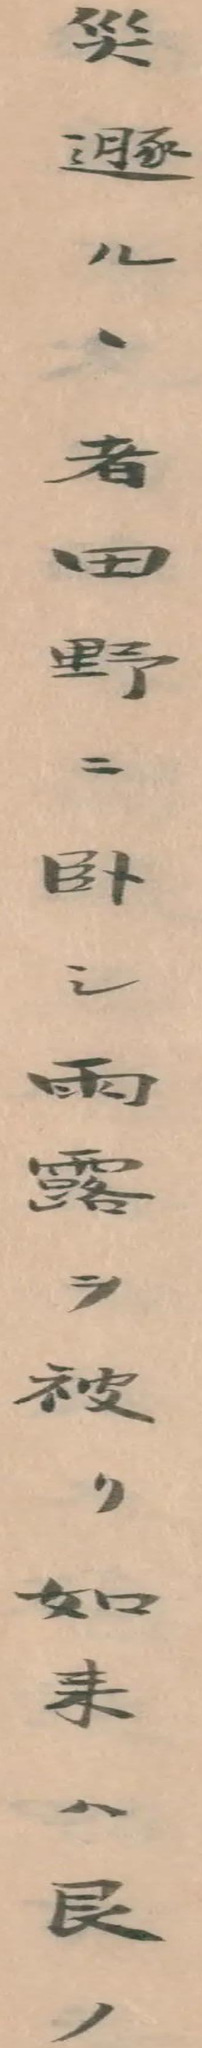災遯ルヽ者田野ニ臥シ雨露ヲ被リ如来ハ艮ノ
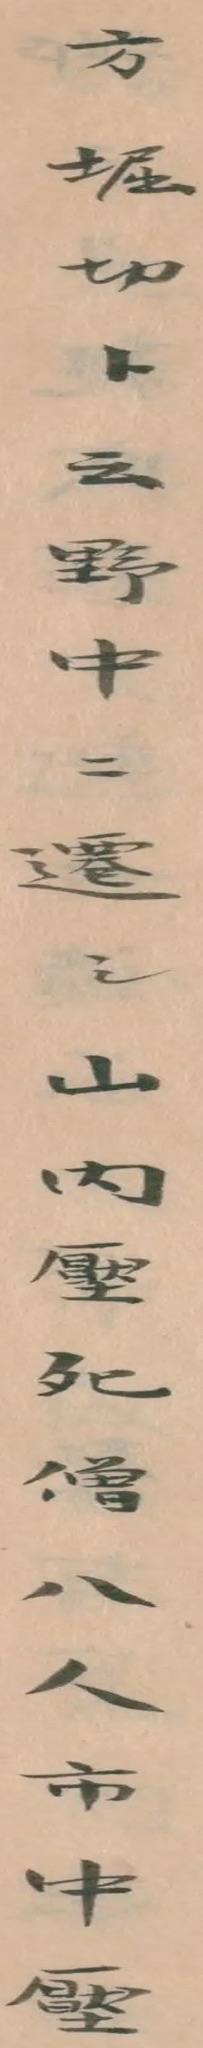方堀切ト云野中ニ遷シ山内圧死僧八人市中圧
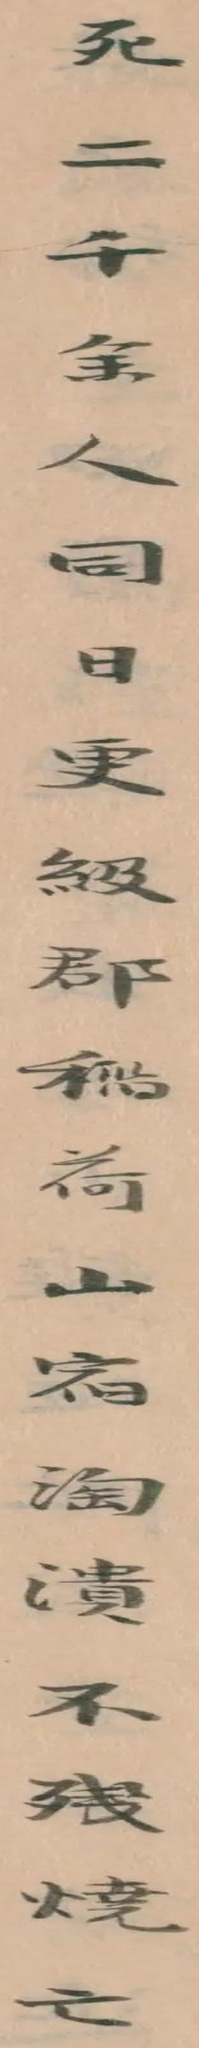死二千余人同日更級郡稲荷山宿淘潰不残焼亡
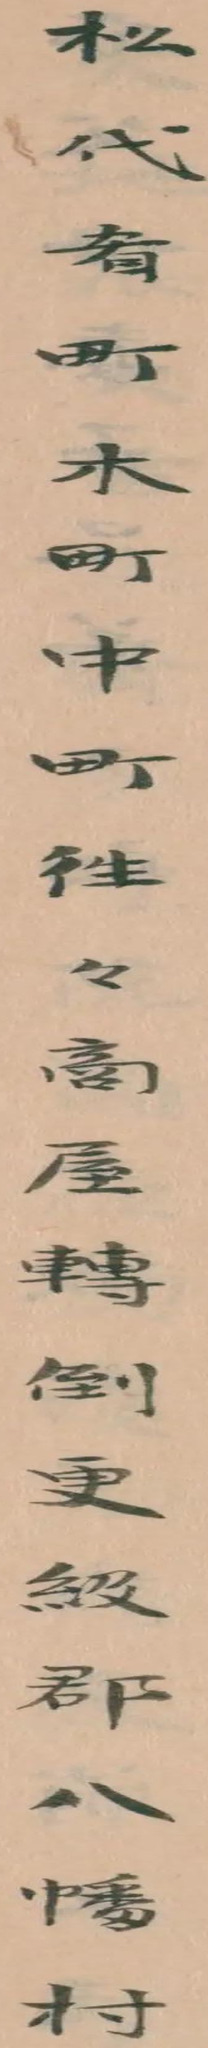松代肴町木町中町往々商屋転倒更級郡八幡村
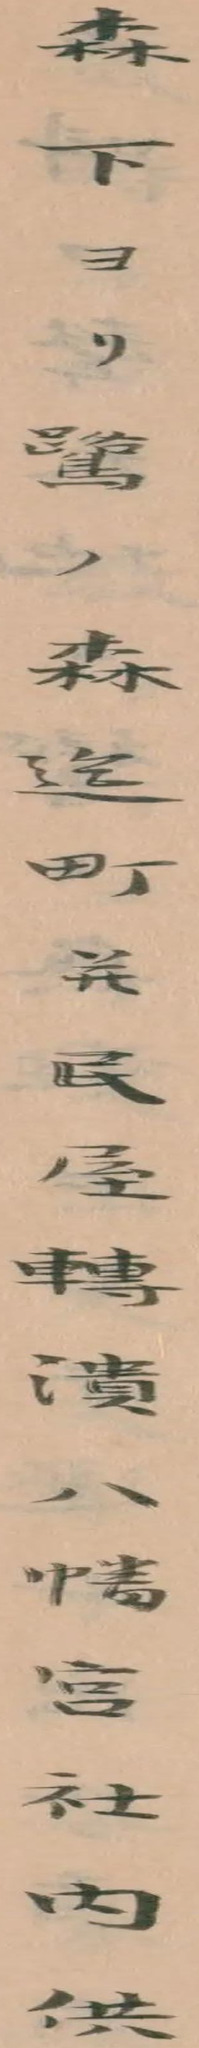森下ヨリ鷺ノ森迄町并民屋転潰八幡宮社内供
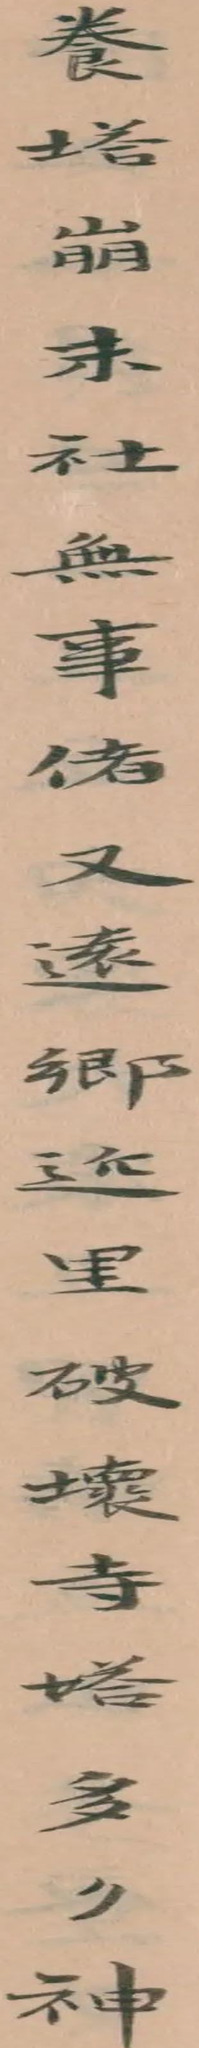養塔崩末社無事偖又遠郷近里破壊寺塔多ク神
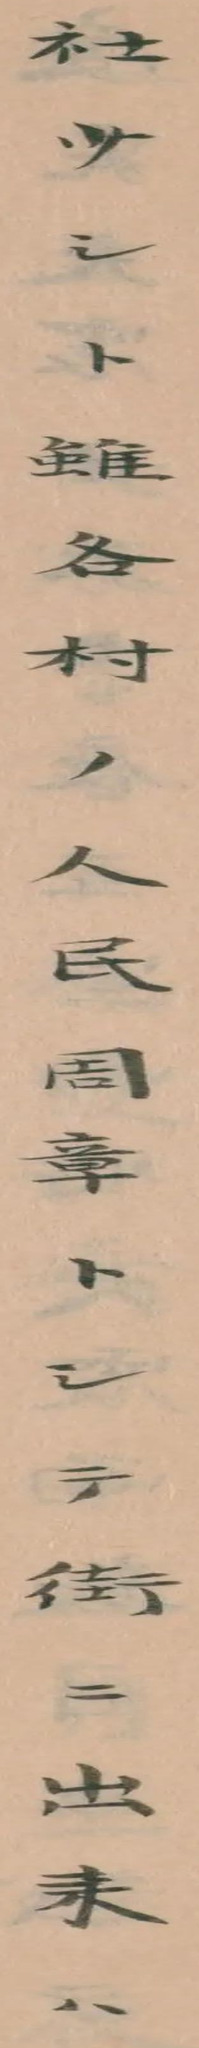社少シト雖各村ノ人民周章トシテ街ニ出来ハ
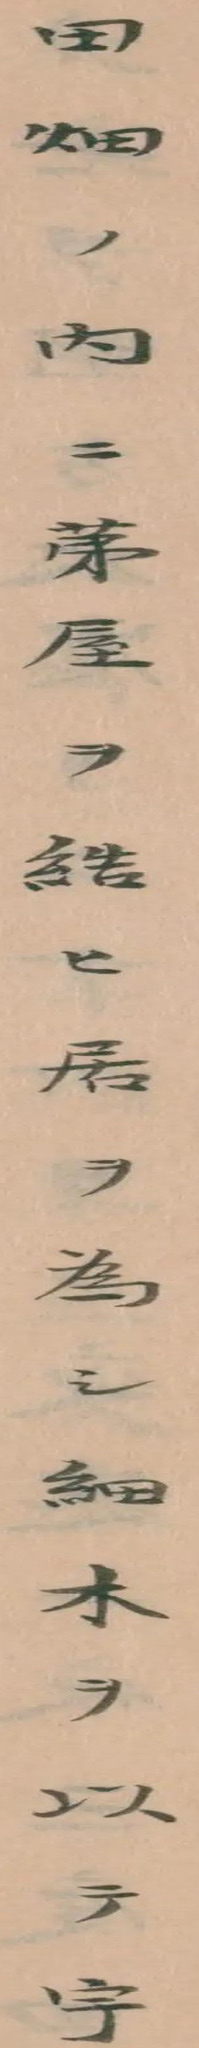田畑ノ内ニ茅屋ヲ結ヒ居ヲ為シ細木ヲ以テ宇
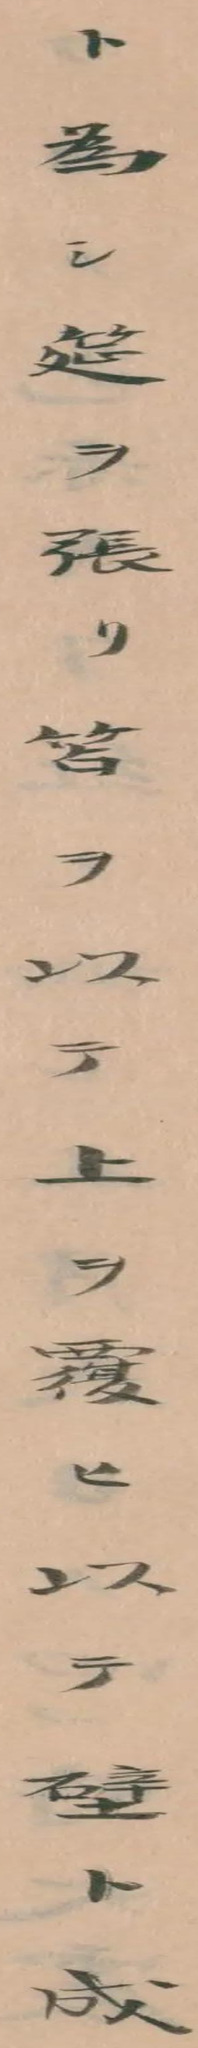ト為シ筵ヲ張リ笘ヲ以テ上ヲ覆ヒ以テ壁ト成
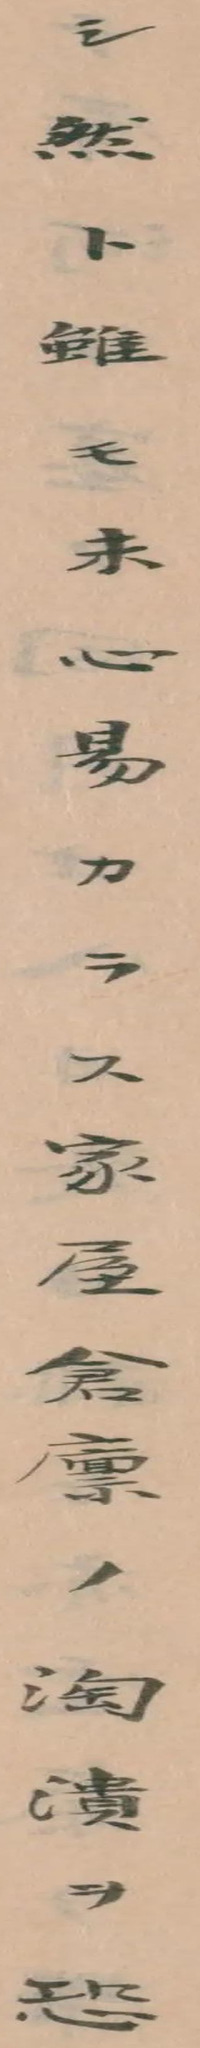シ然ト雖モ未心易カラス家屋倉廩ノ淘潰ヲ恐
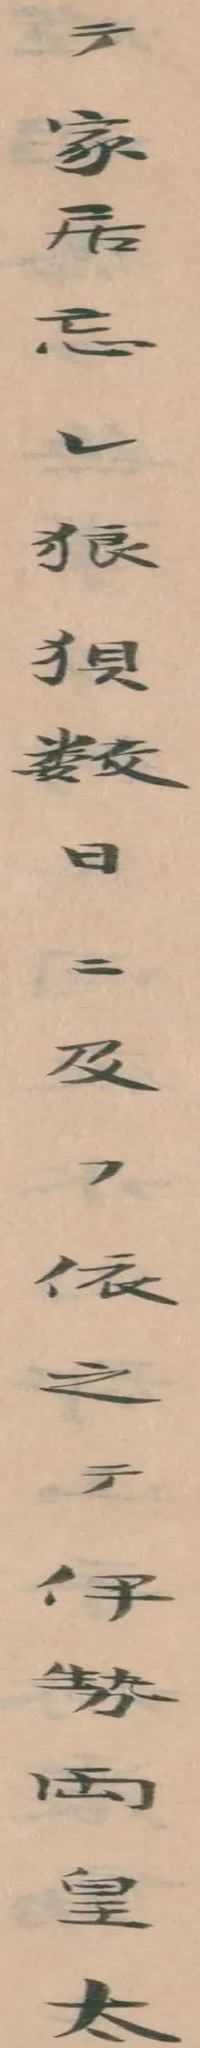テ家居忘レ狼狽数日ニ及フ依之テ伊勢両皇太
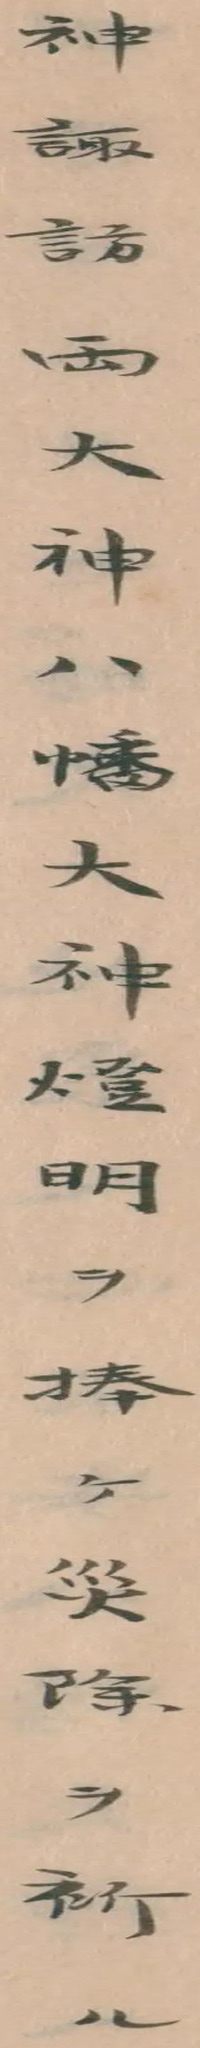神諏訪両大神八幡大神燈明ヲ捧ケ災除ヲ祈ル
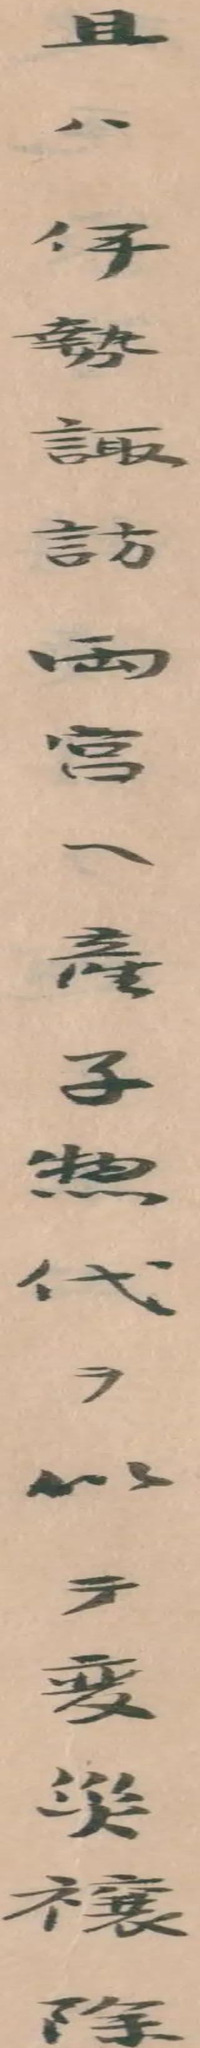且ハ伊勢諏訪両宮ヘ産子惣代ヲ以テ変災穣除
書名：地災撮要. 巻5-6(地震之部)
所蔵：国立国会図書館 National Diet Library, JAPAN
